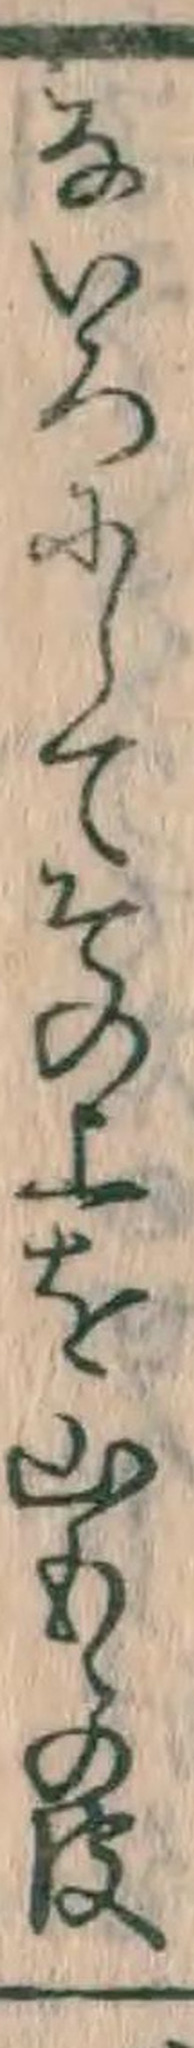ないろにしてその上を山もゝの皮
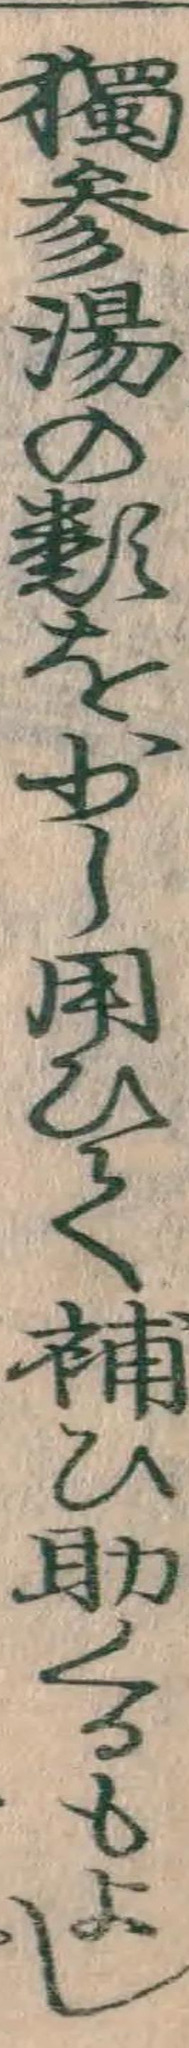獨参湯の類を少し用ひて補ひ助くるもよし
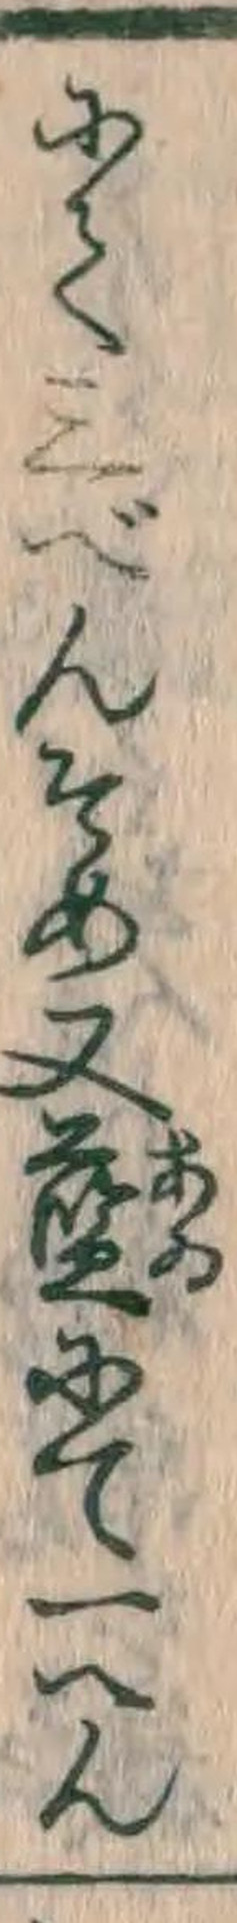にて三べんそめ又藍にて一へん
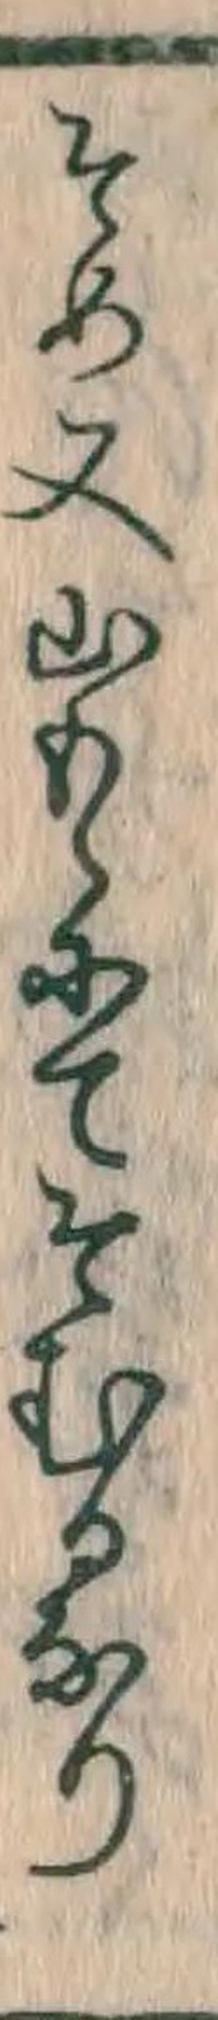そめ又山もゝにてそむるなり
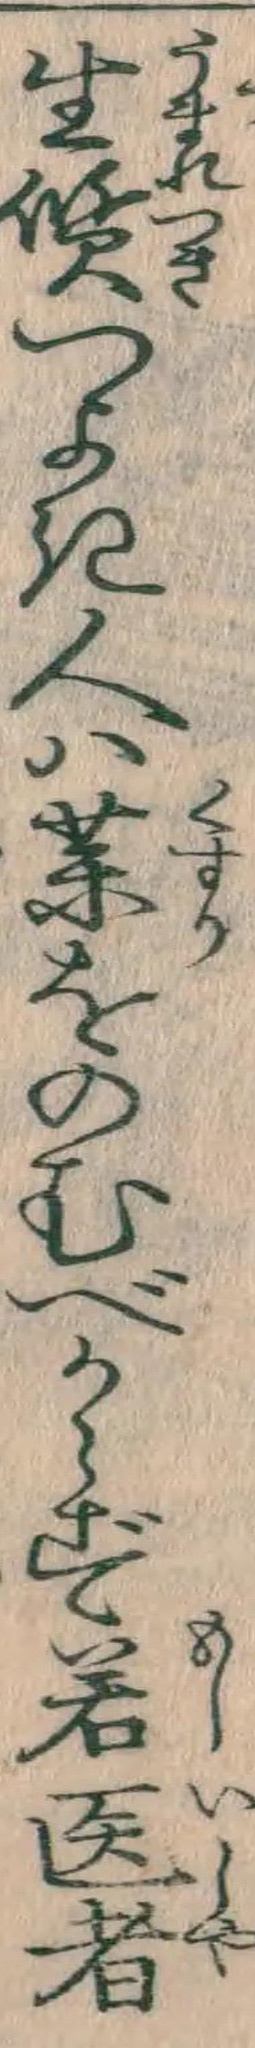生質つよき人は薬をのむべからず若医者
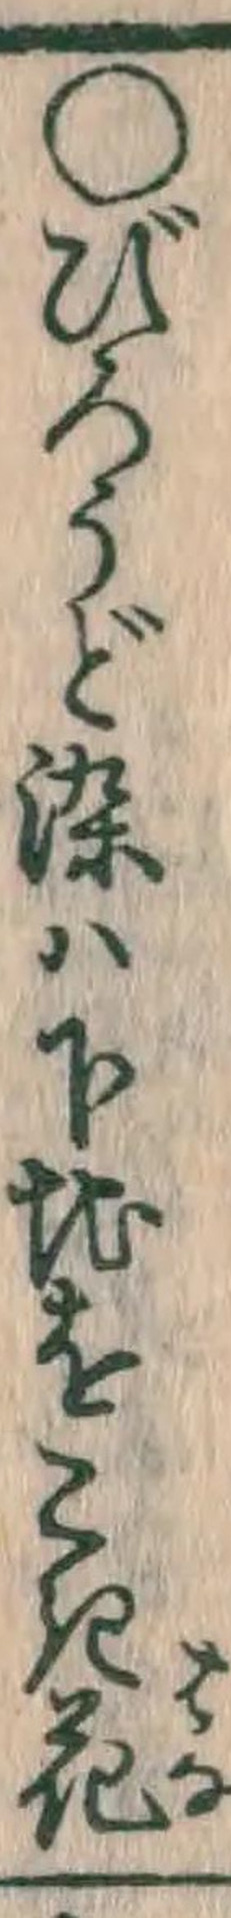○びろうど染は下地をこき花
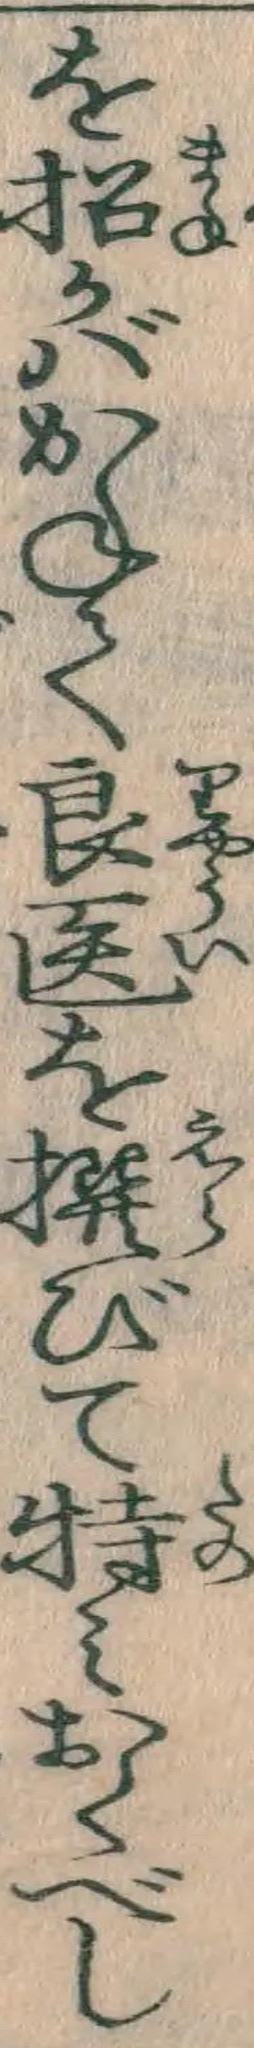を招かばかねて良医を撰びて特みおくべし
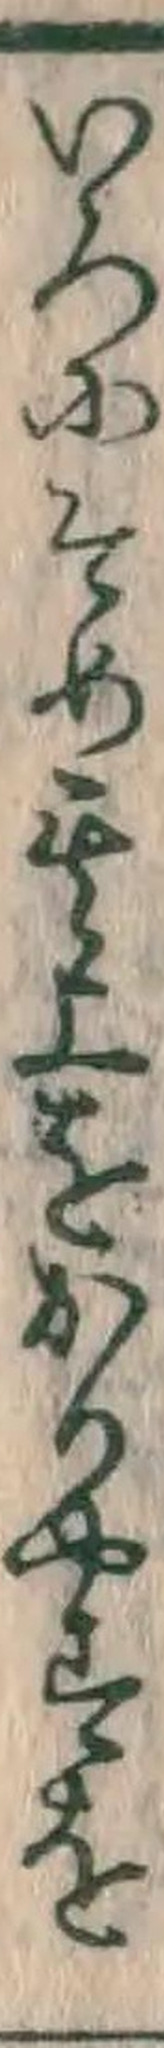いろにそめ其上をかりやすを
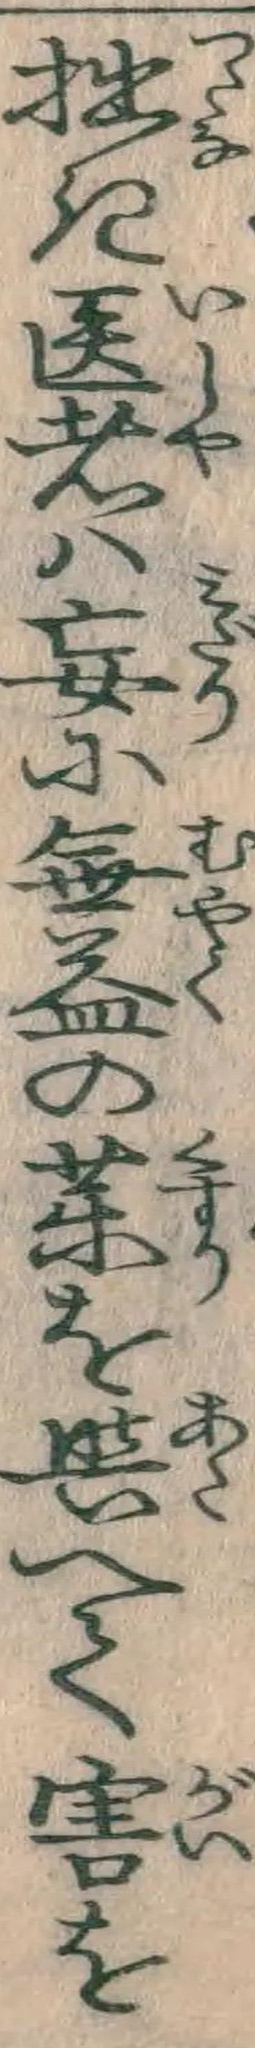拙き医者は妄に無益の薬を與へて害を
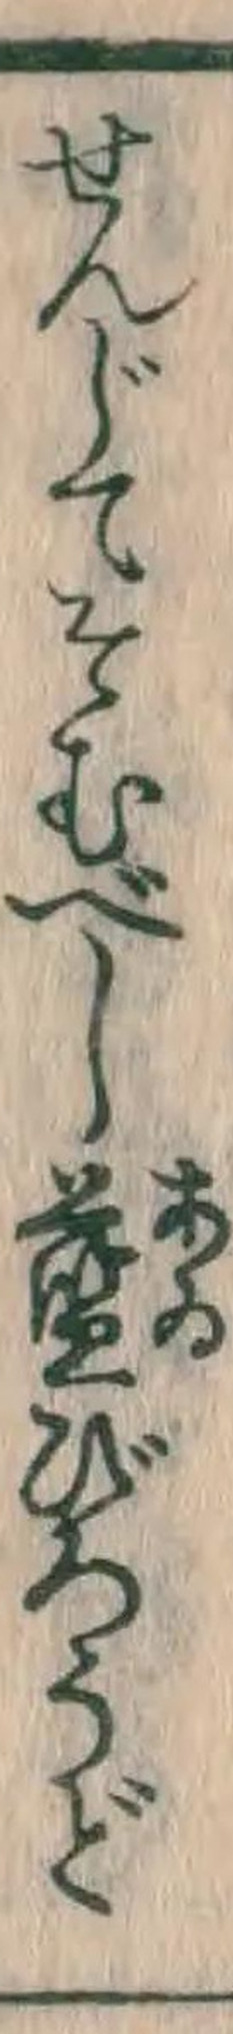せんじてそむべし藍びろうど
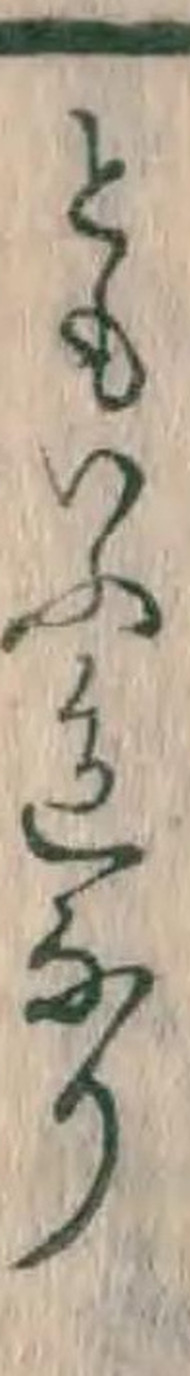ともいふ色なり
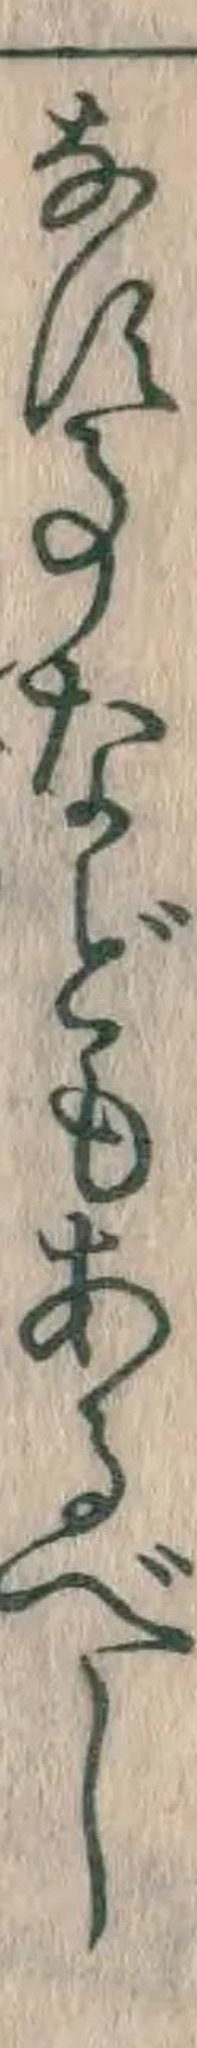なす事などもあるべし
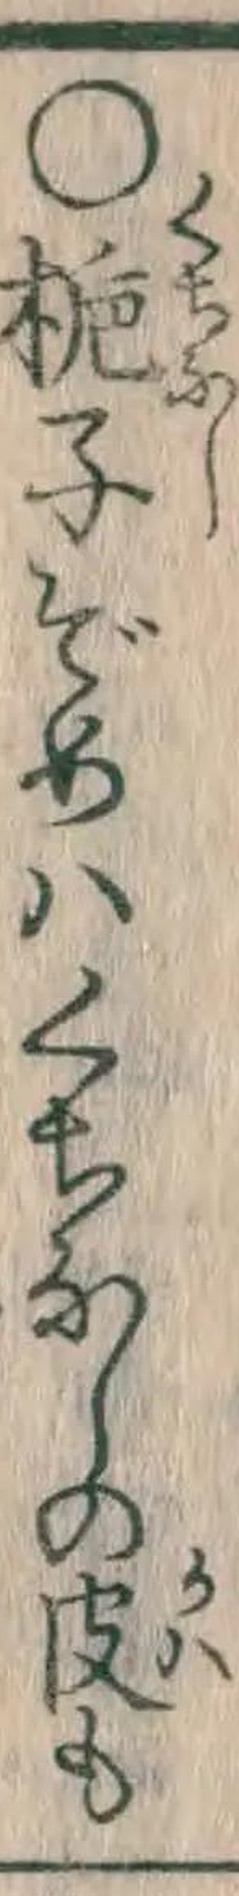○梔子ぞめはくちなしの皮も
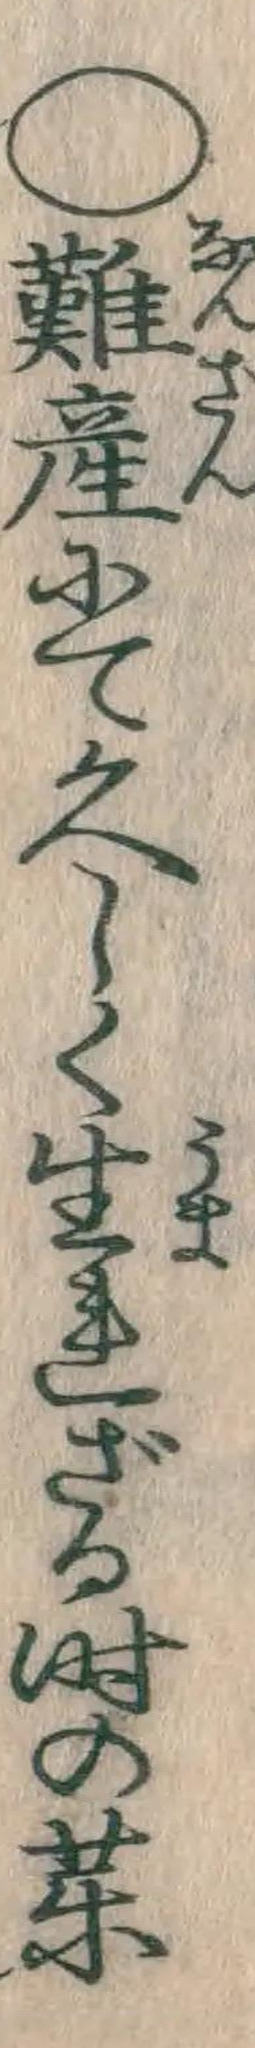○難産にて久しく生れざる時の薬
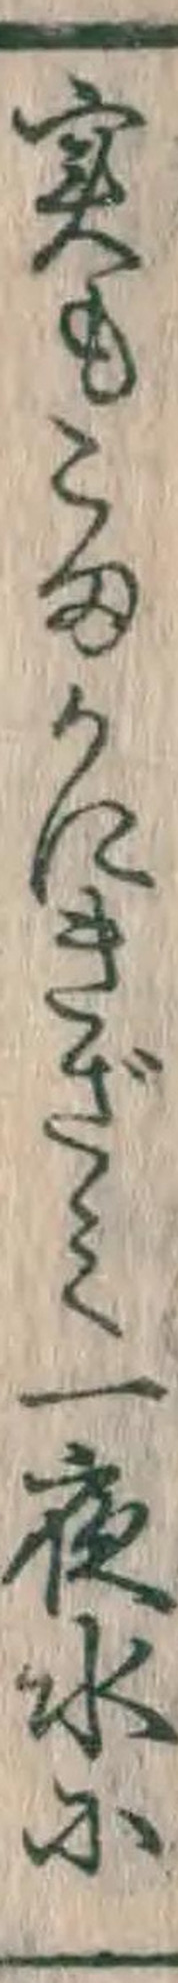実もこまかにきざみ一夜水に
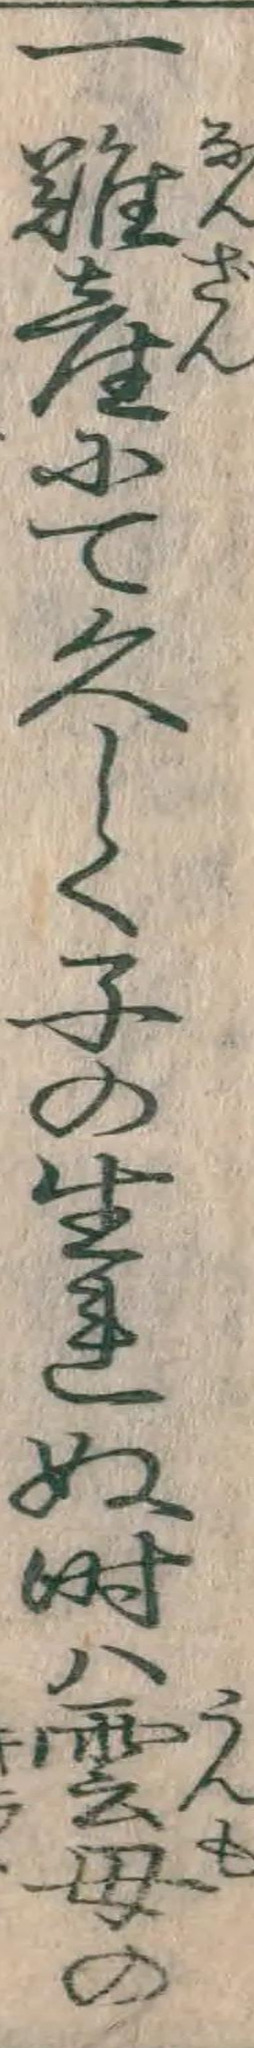一難産にて久しく子の生れぬ時は雲母の
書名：広益秘事大全 3巻. [3]
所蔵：国立国会図書館 National Diet Library, JAPAN
